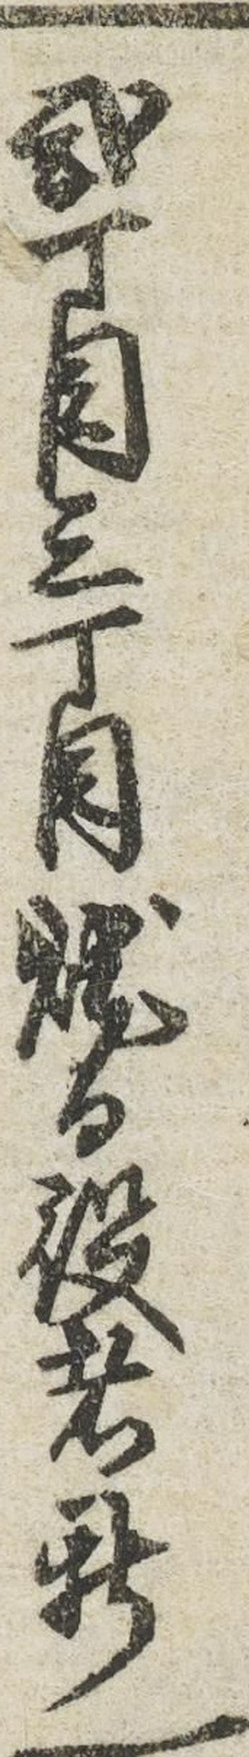弐丁目三丁目焼る役者新
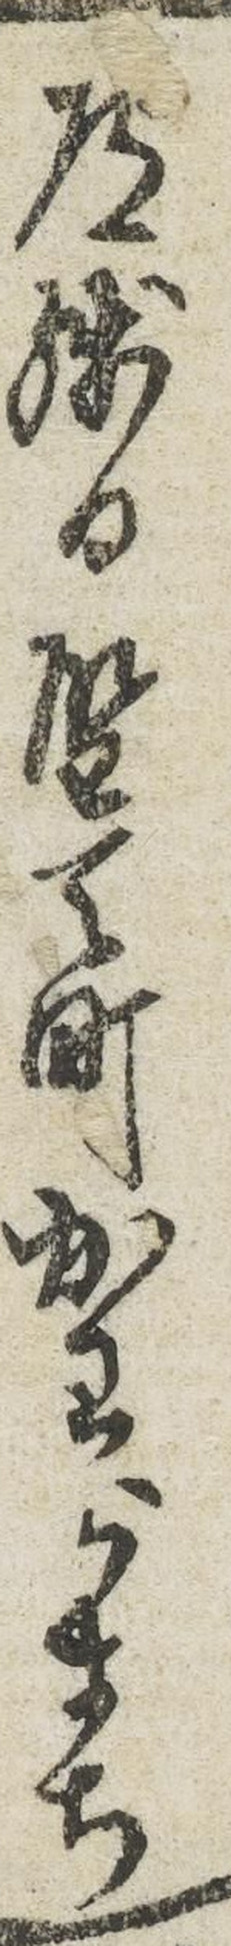道残る聖天町かわらまち
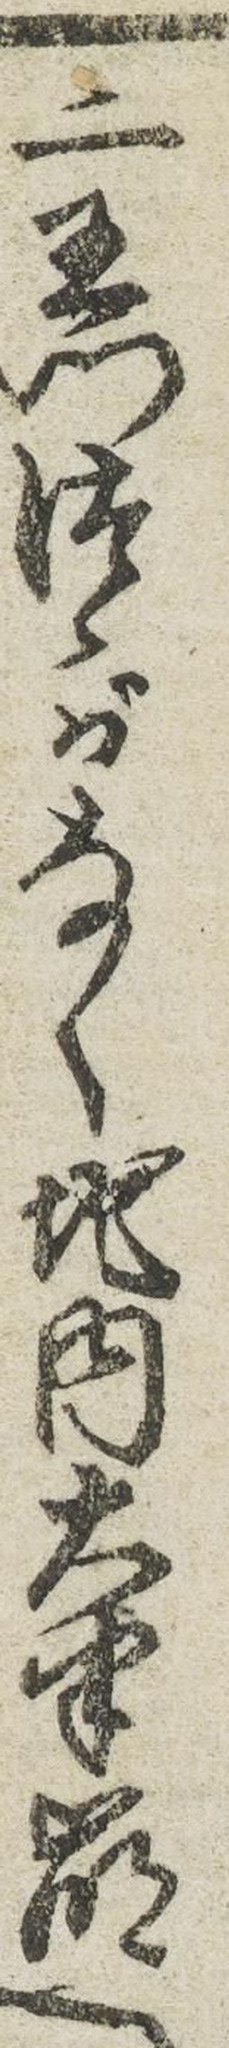二王門徒ゝがなく地内大半崩
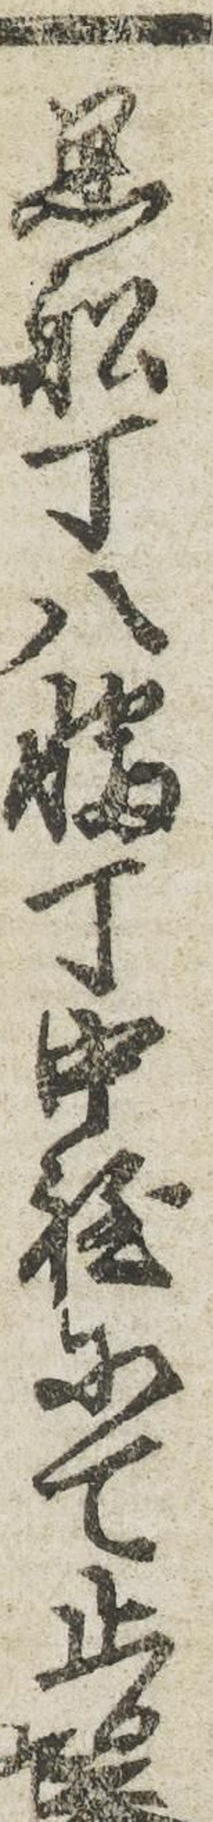黒船丁八幡丁中程にて止る

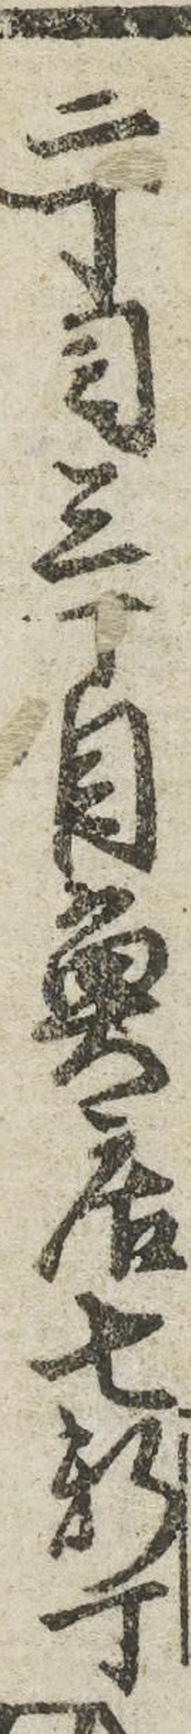二丁目三丁目魚店七軒町
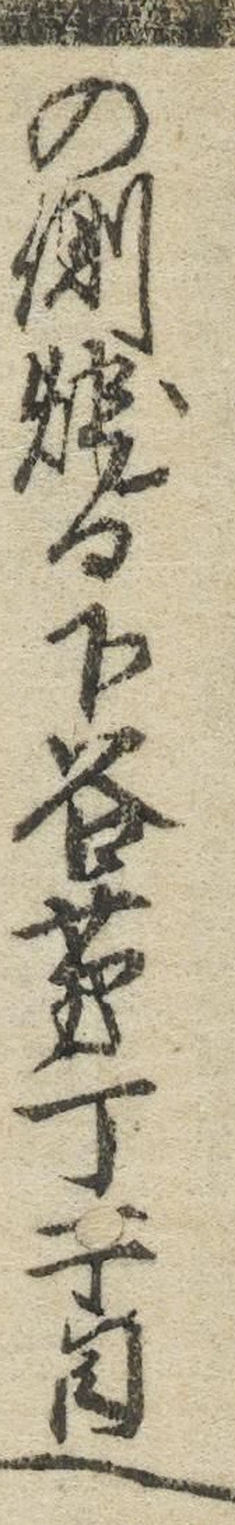の側焼る下谷茅丁一丁目
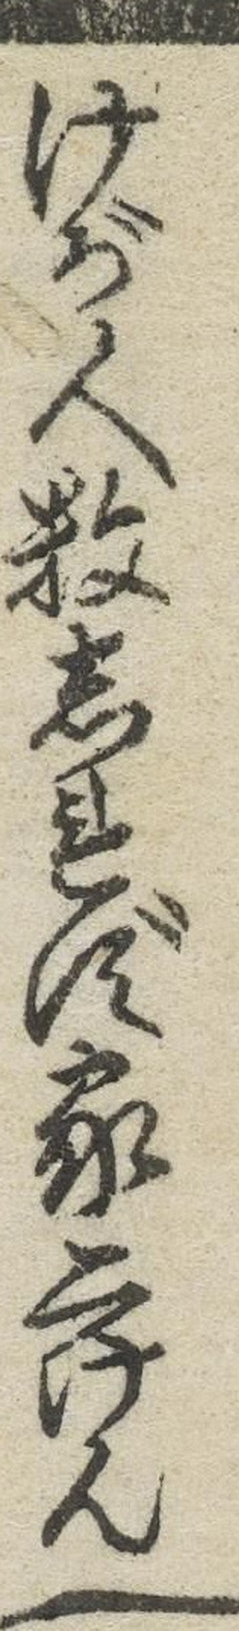けが人数しれず家二けん
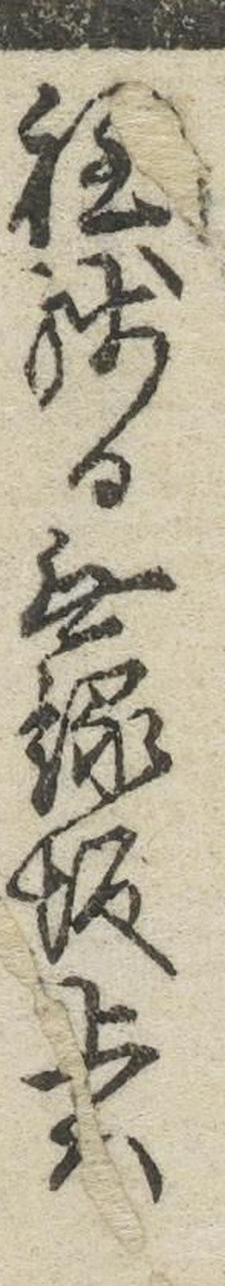程残る無縁坂上ハ
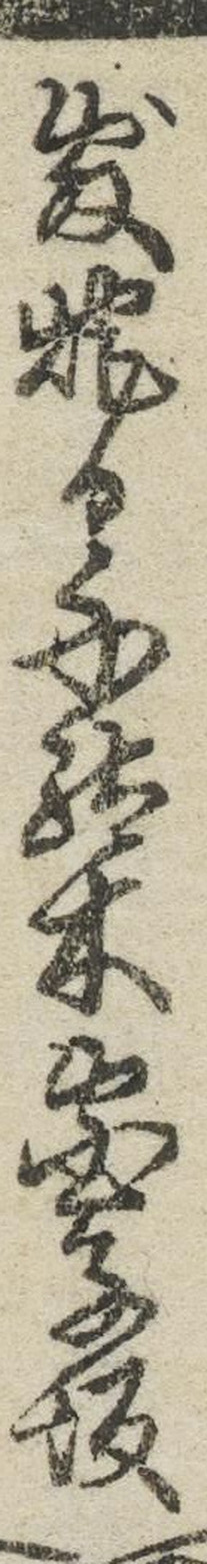敷焼る千駄木団子坂
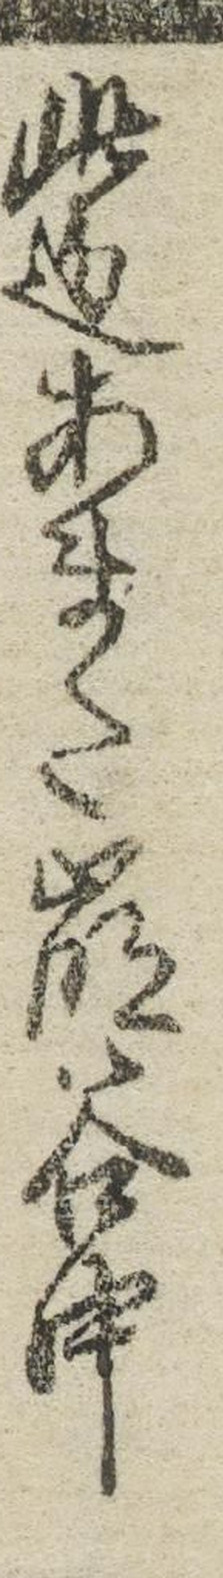此辺あまた崩谷中
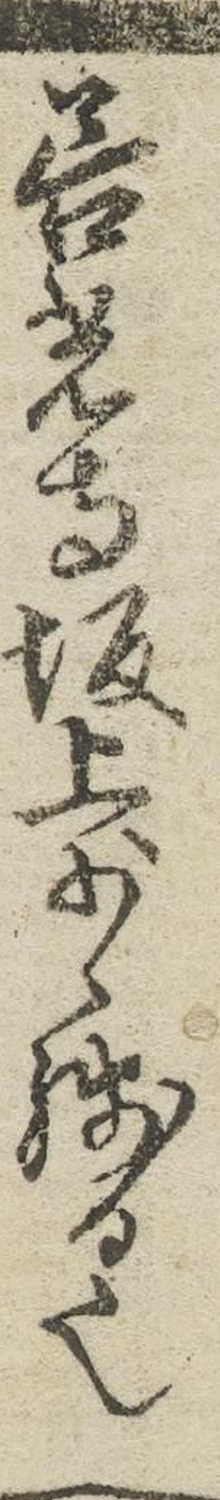善光寺坂上少々残る也
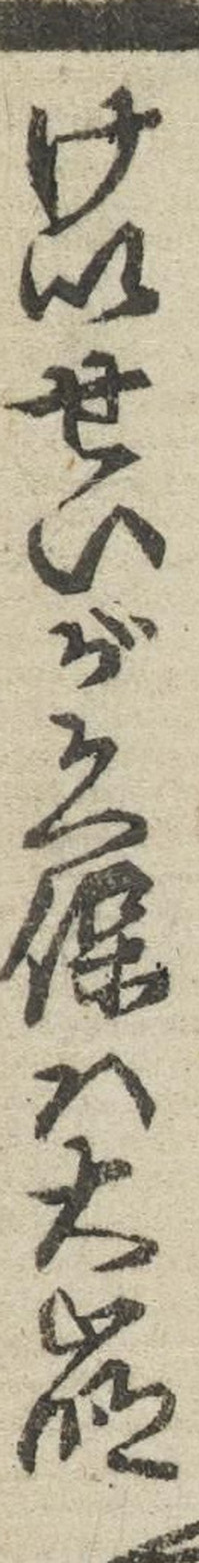けいせいが久保ハ大崩

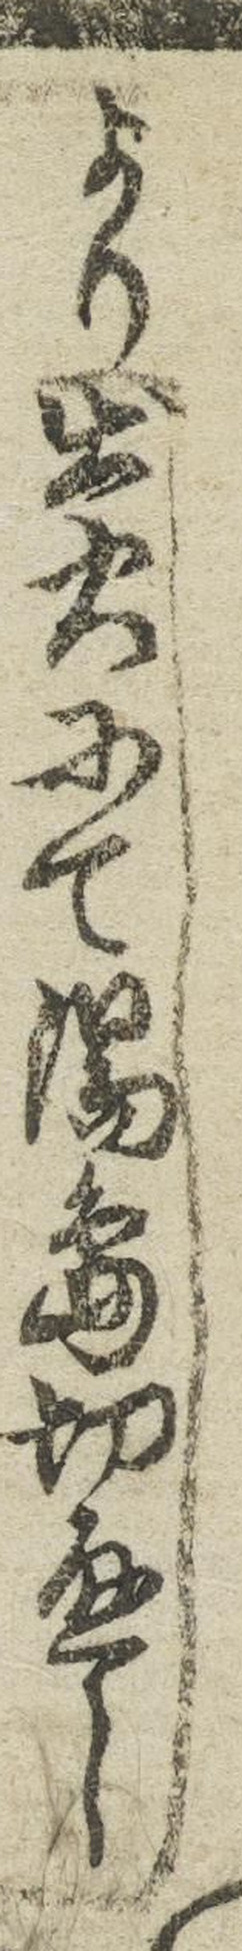より出火にて湯島切通し
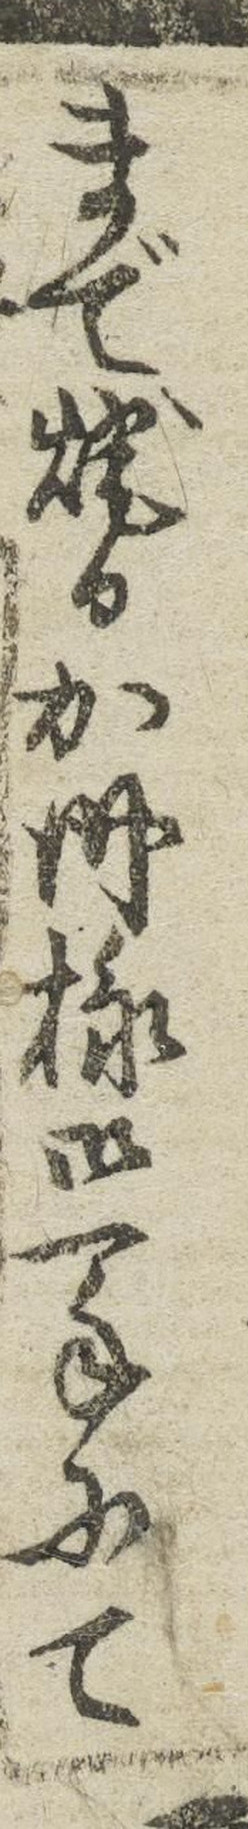まで焼る加州様御一手にて
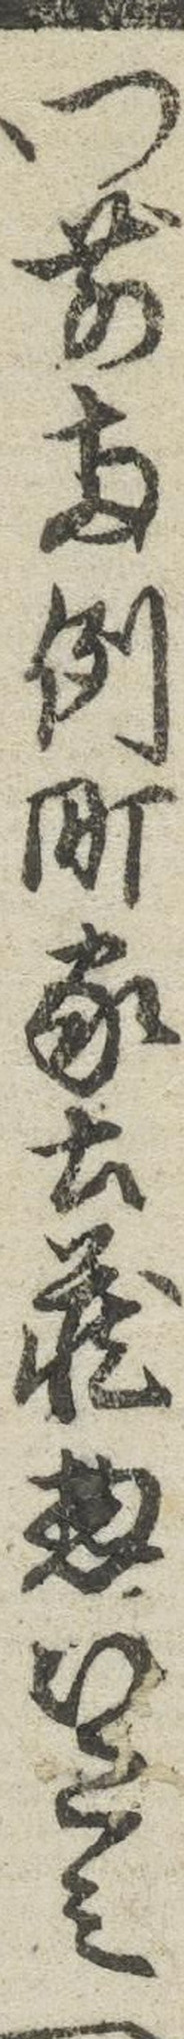門前両側町家土蔵惣いたミ
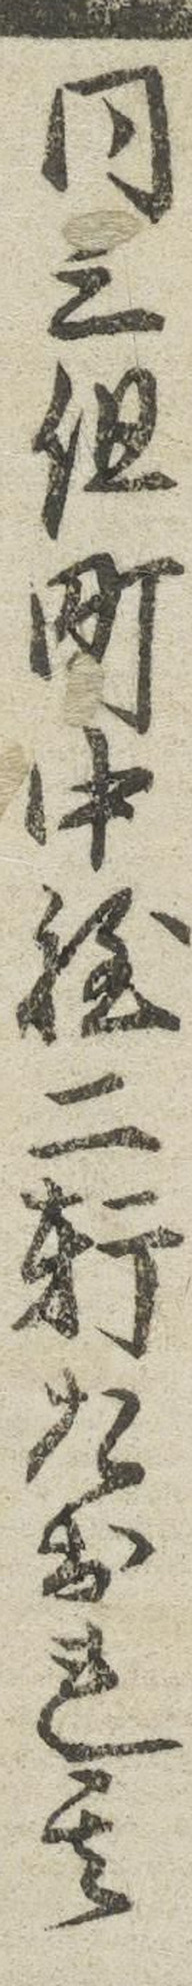同三組町中程二軒たおれ其
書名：関東五街道　江戸大地震出火場所
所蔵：東京大学地震研究所図書室 Earthquake Research Institute Library, The University of Tokyo, JAPAN
